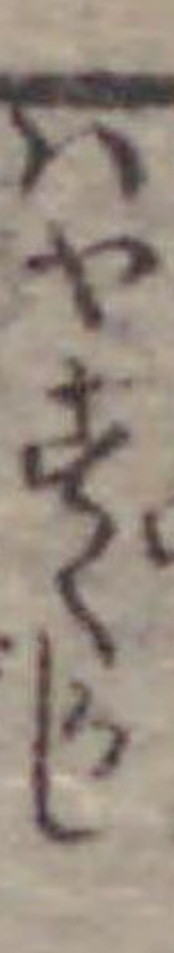はやすくかし
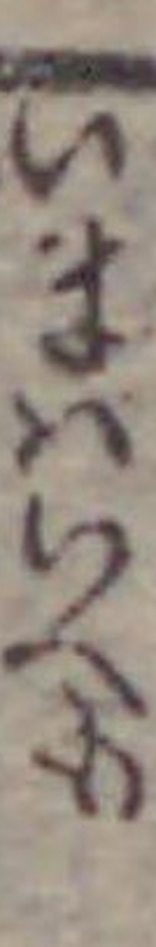いまはいへも
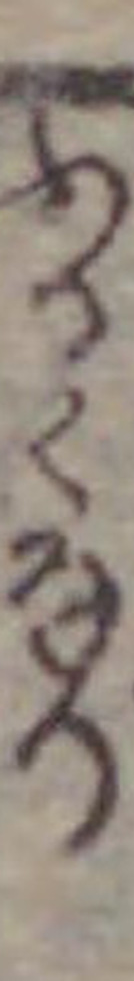ふるくなり
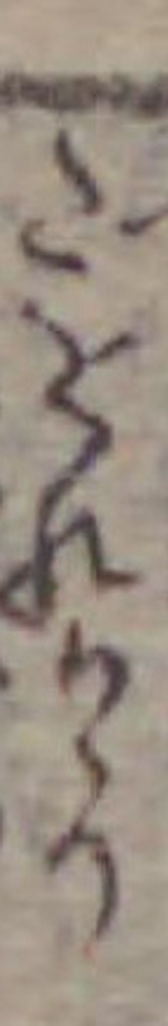たをれかゝり
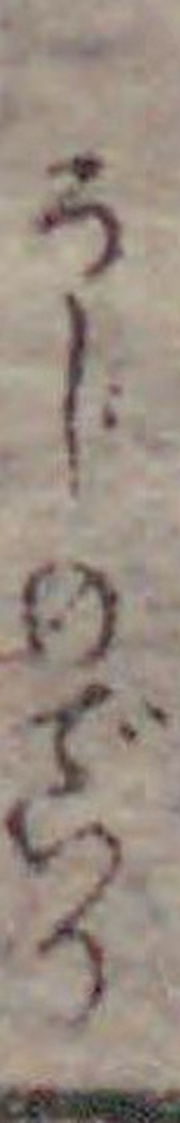ろじのでいり
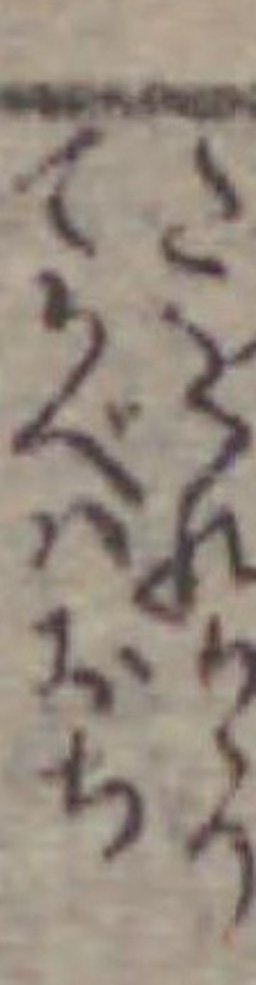てかべはおち
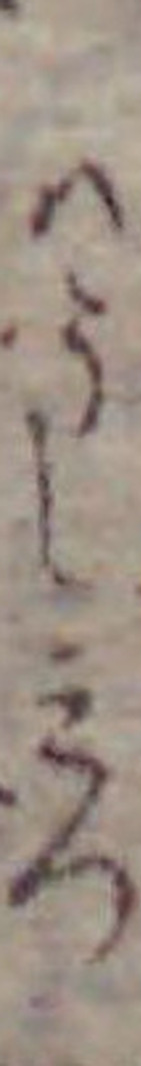はうしみつ
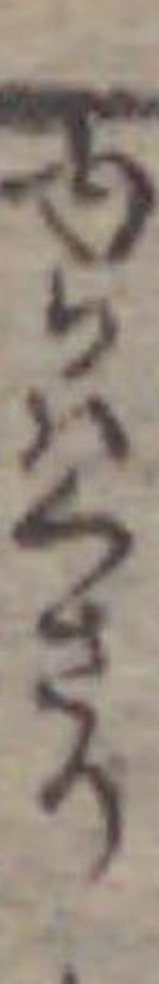ゆかはくさり
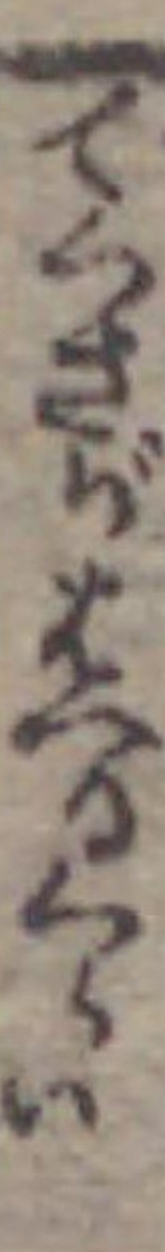てくさがはへるくらい
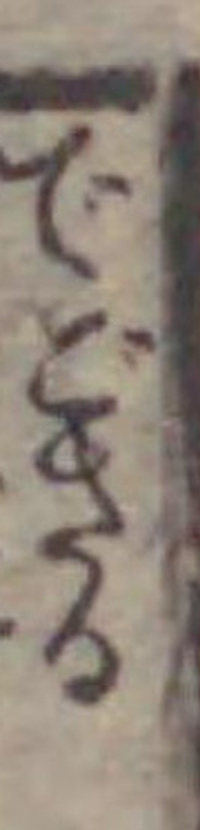でごさる
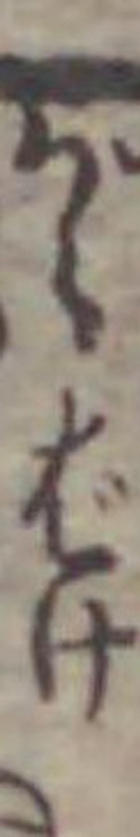からばけ
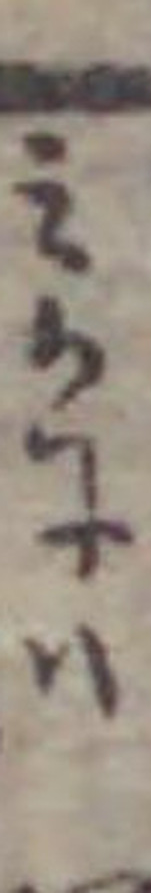みかには
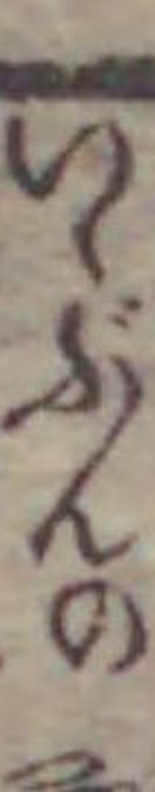いゝぶんの
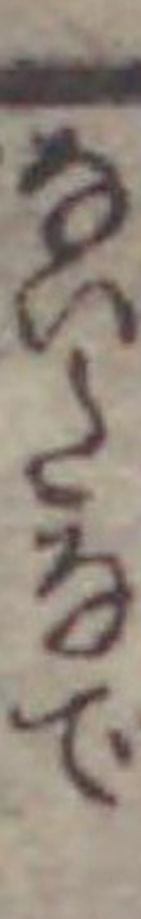ないたなで
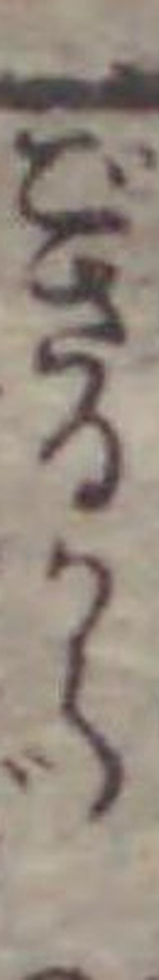ごさるから
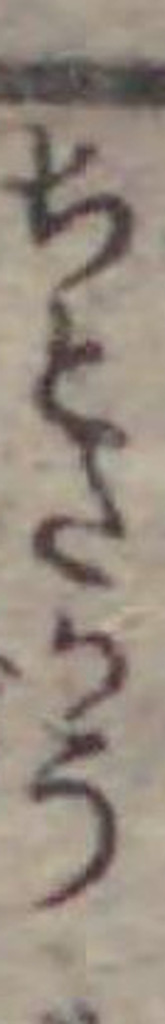ちとたかう
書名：化物見世開 : 2巻
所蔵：国立国会図書館 National Diet Library, JAPAN
